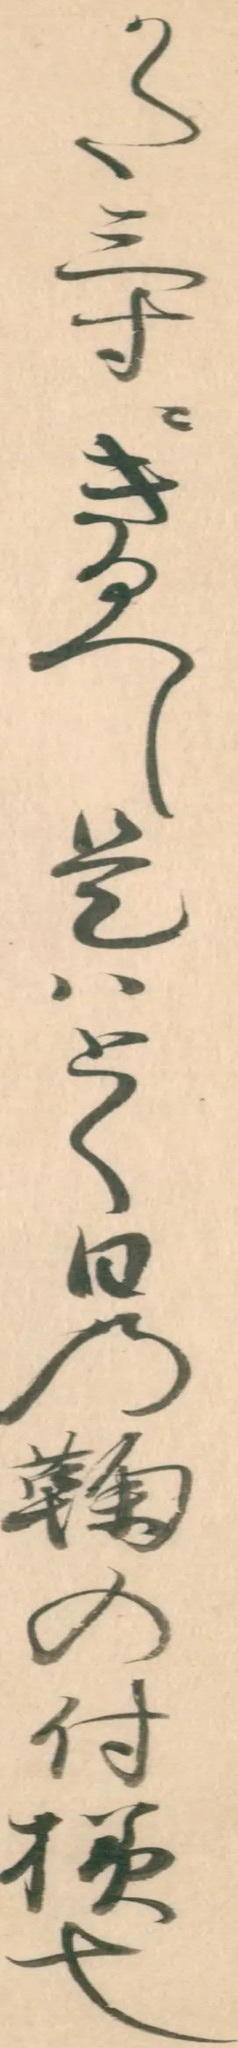かた三寸にきすへし是はとく日の鞠の付様也
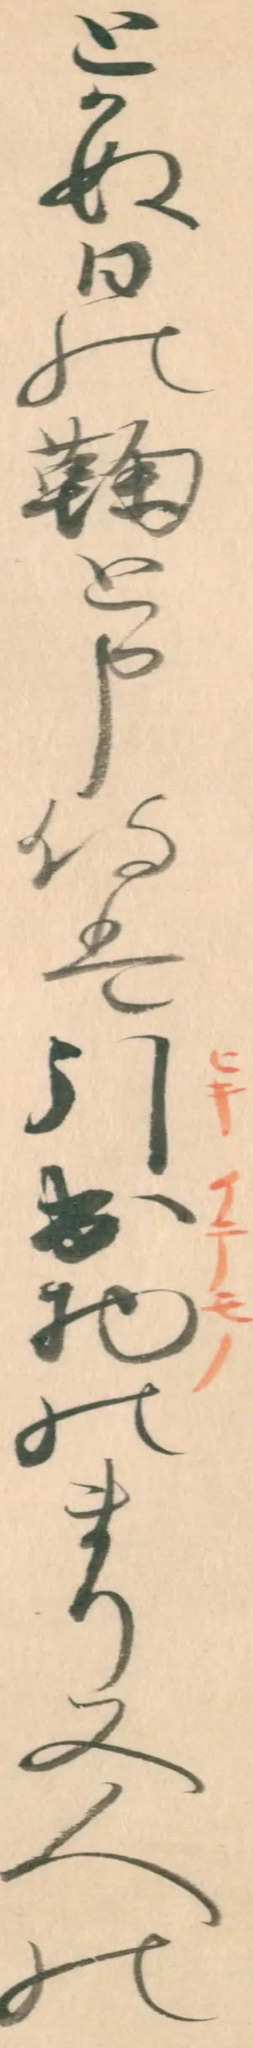とかぬ日の鞠と申侍は引出物のまり又人の
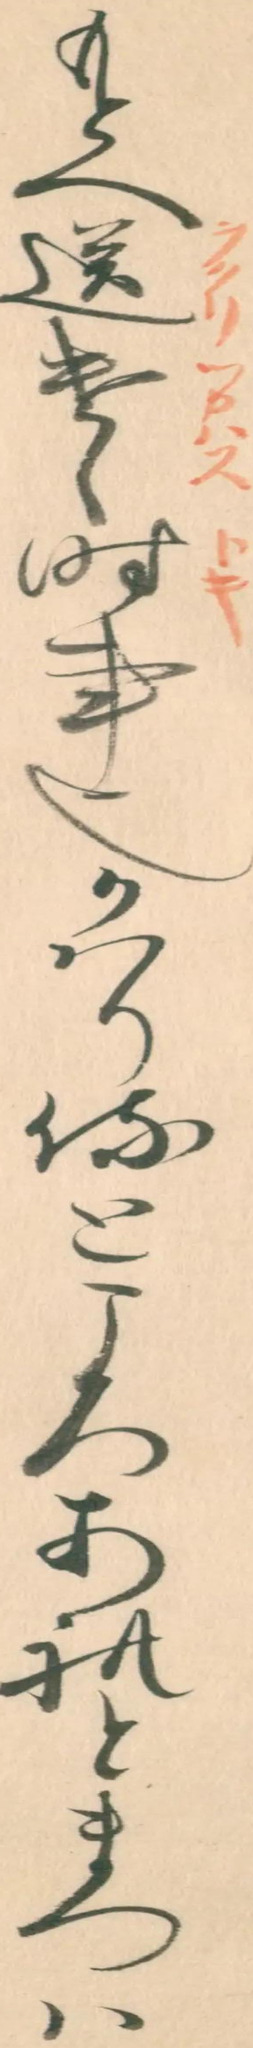もとへ送遣す時事也かはりねところあれとまつは
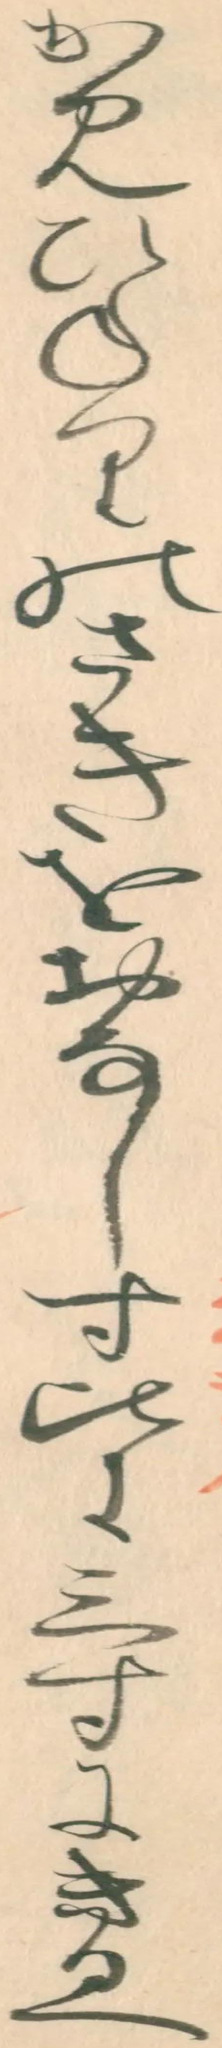かみひねりのさきをおなし寸法に三寸にきるへ
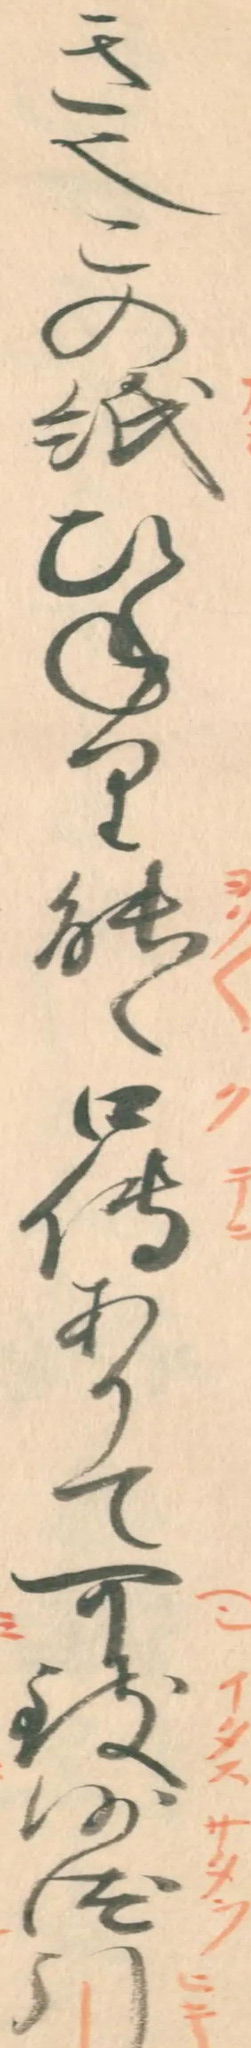き也この紙ひねり能々口傳ありて可被沙汰引
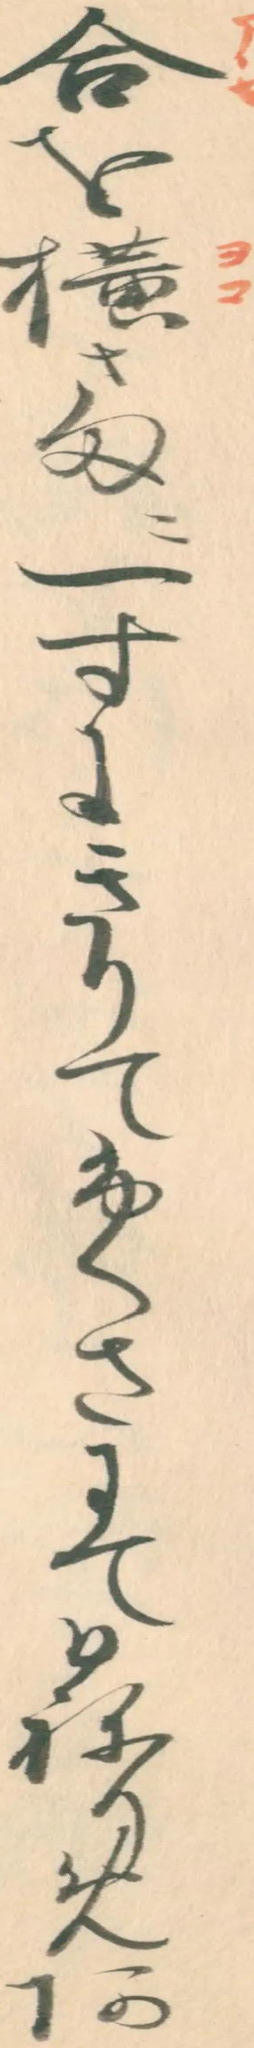合を横さまに一寸にきりてふくさにてひねりめあ
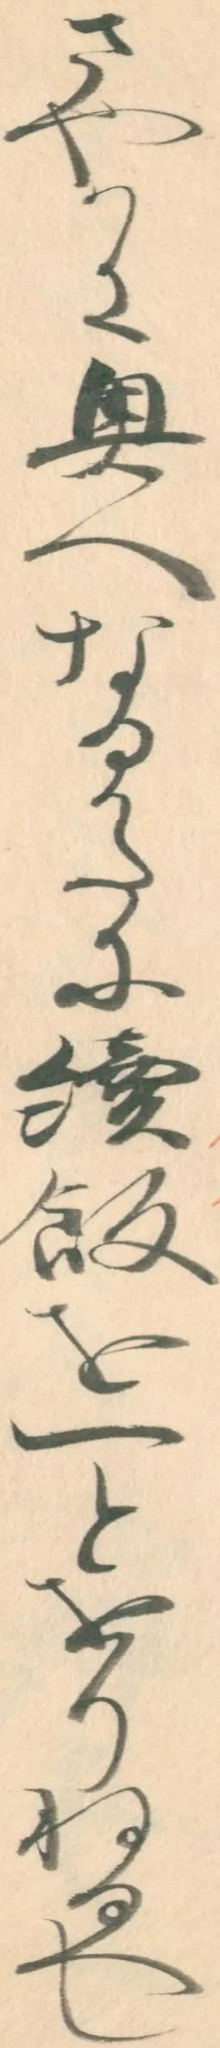さやかに奥へなるかたに續飯を一とほりねるへし
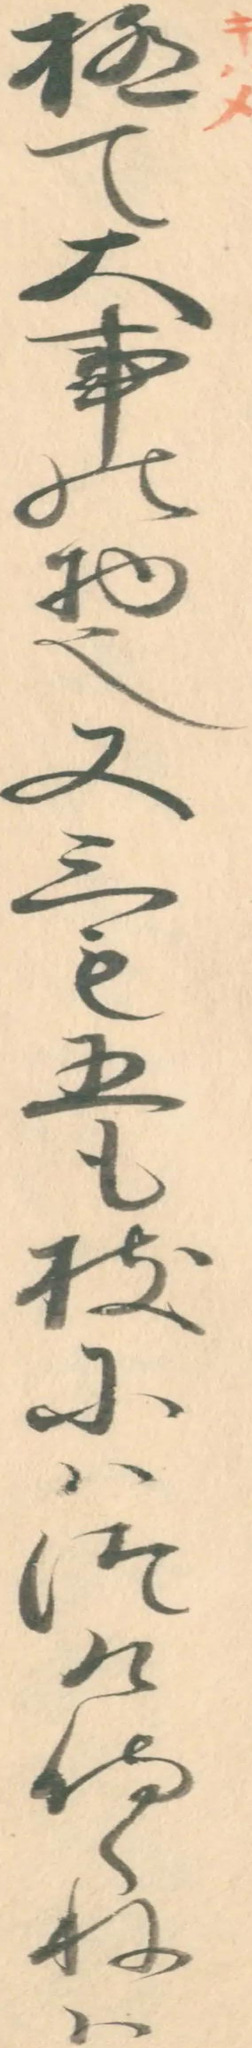極て大事の物也又三も五も枝にはつけ侍らねは

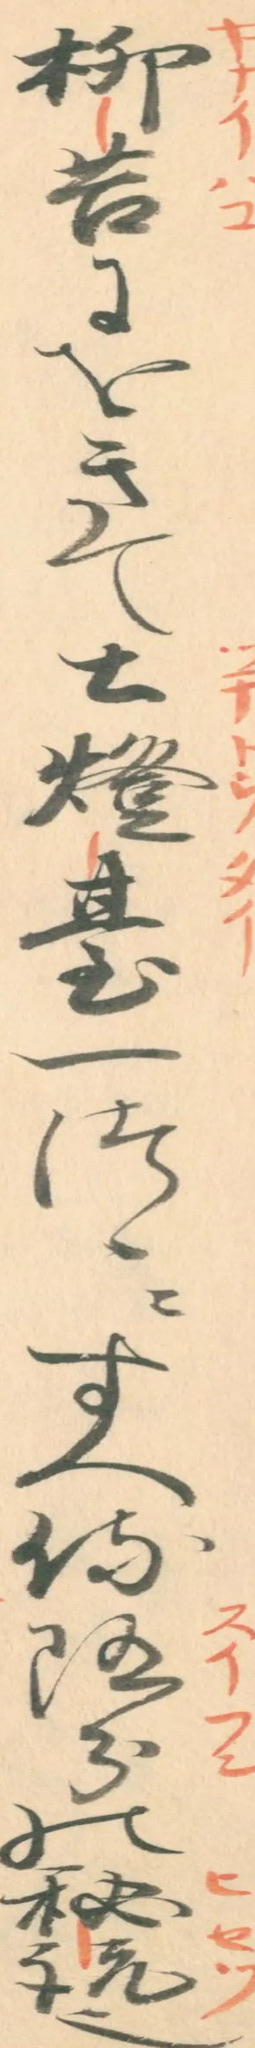柳にをきて土燈臺一つゝにすへ侍随分の秘説也
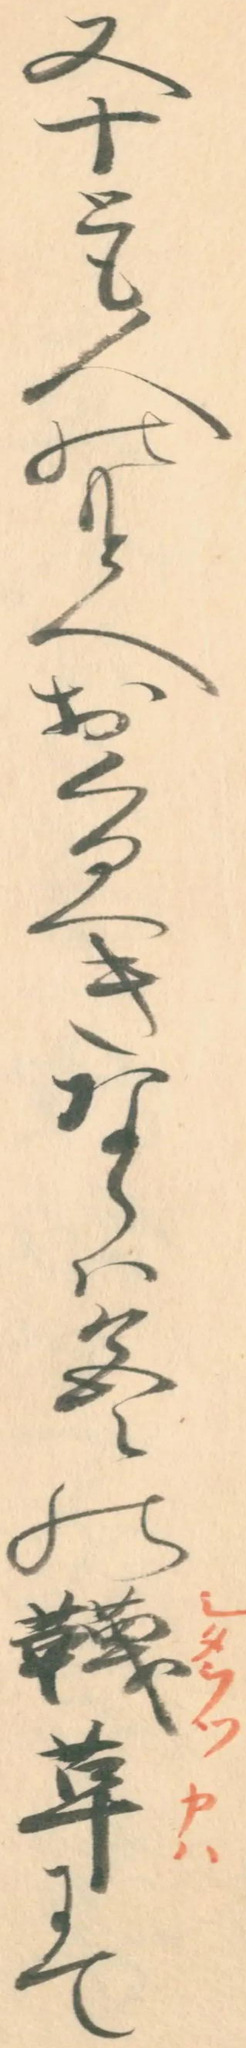又十とも人のもとへおくるへきならは色々韈革にて
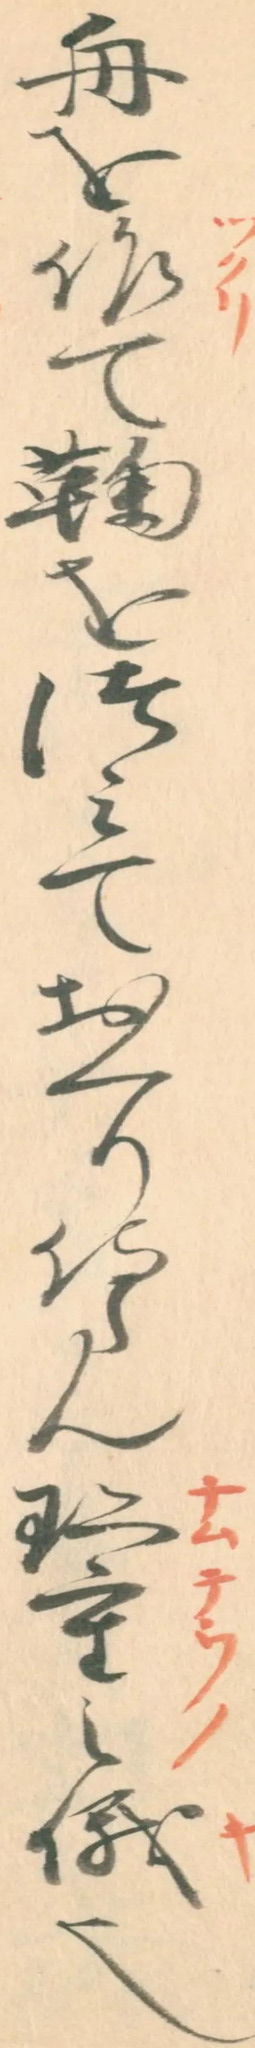舟を作りて鞠をつみておくり侍らん珍重の儀也
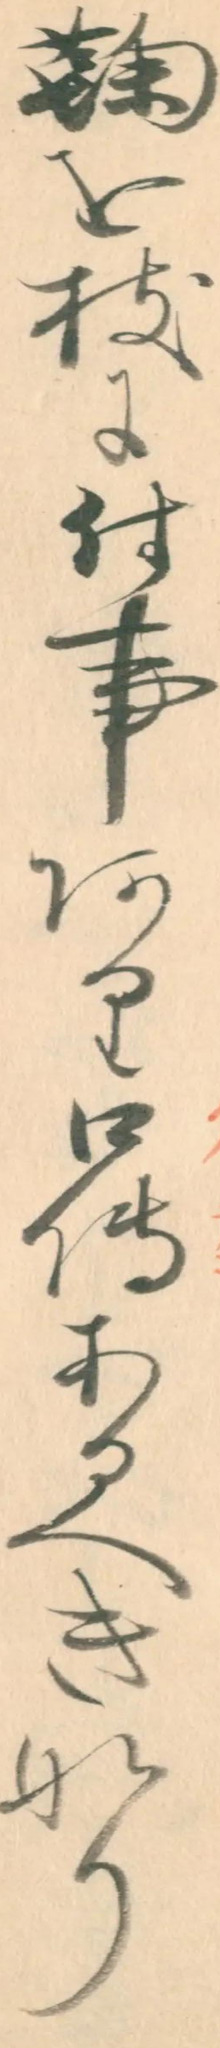鞠を枝に付事あり口傳あるへきなり
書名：遊庭秘抄 2巻. [1]
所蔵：国立国会図書館 National Diet Library, JAPAN
